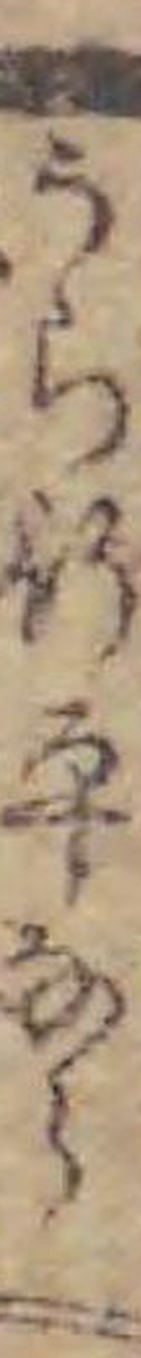うら行平なら
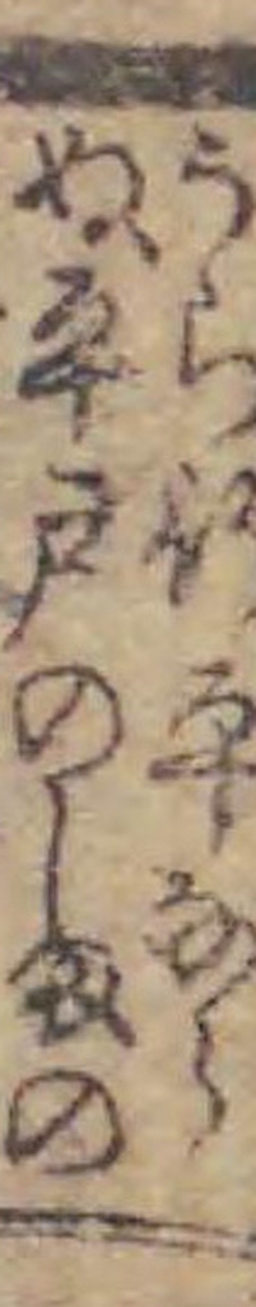ぬ平戸のしまの
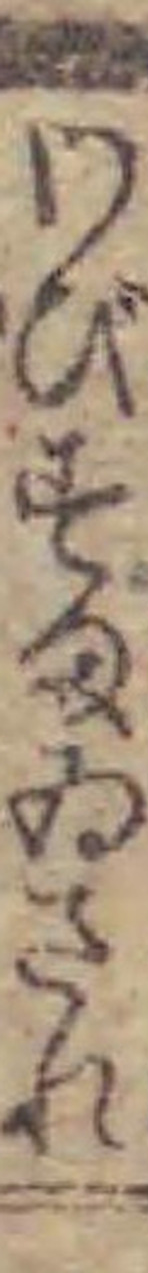わびすまゐされ
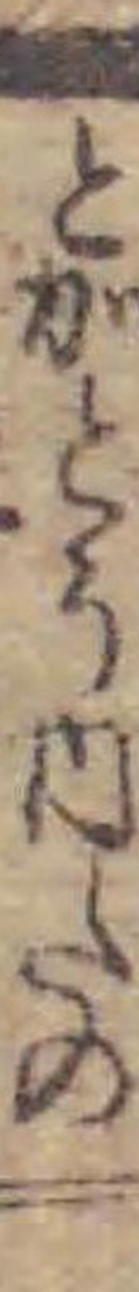と加とう内たの
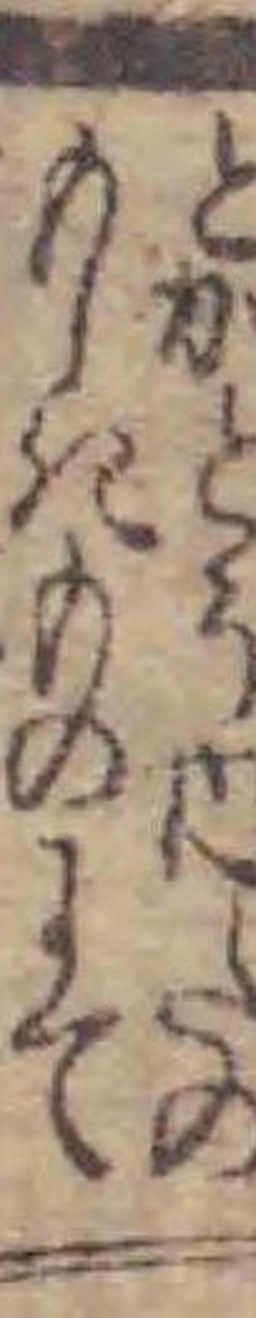もしきものにて
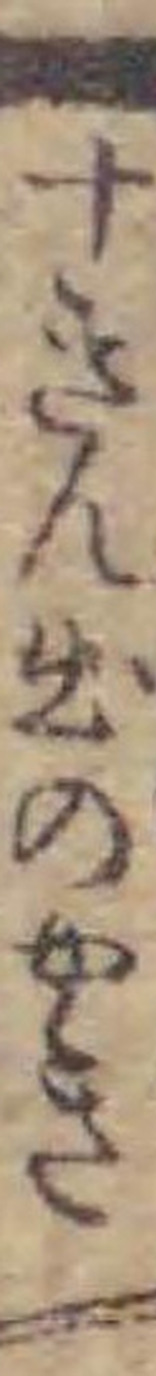十きん出のやき
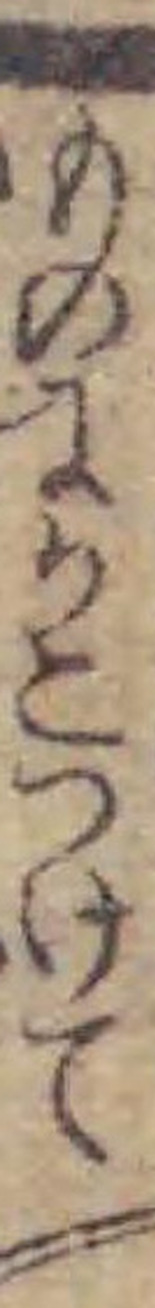ものにかこつけて
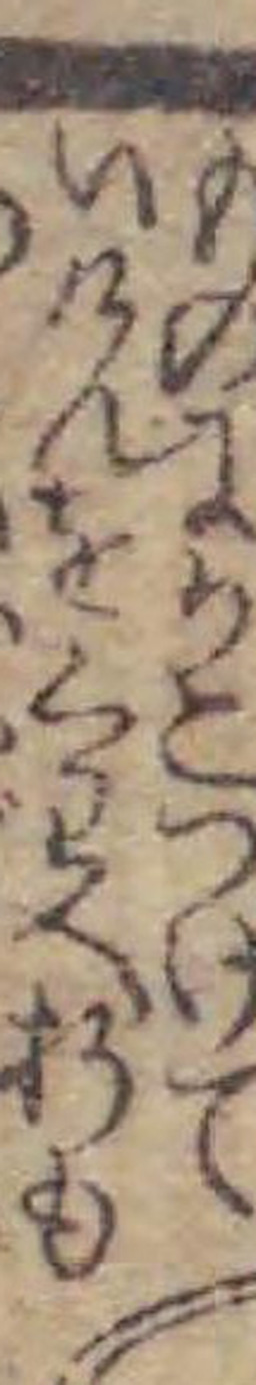いけんをくわへ折も
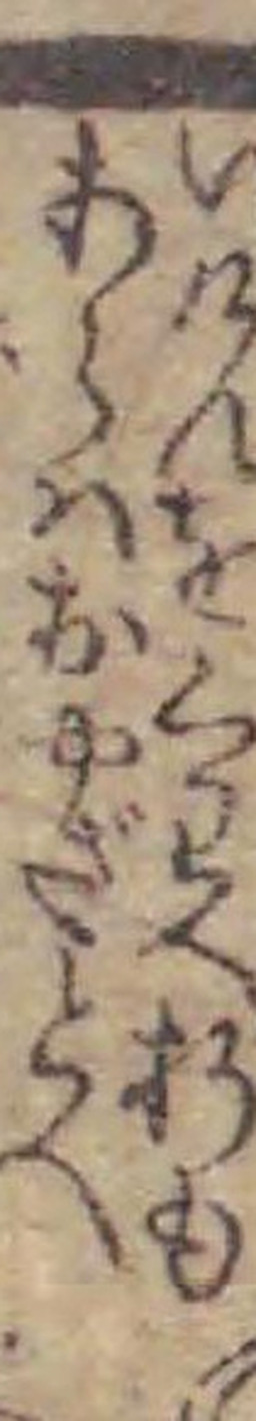あらはおやざとへ
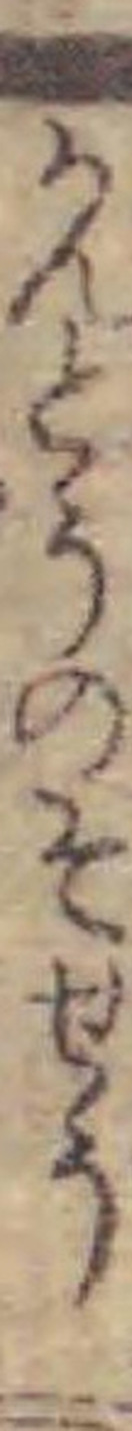かんとうのそせう
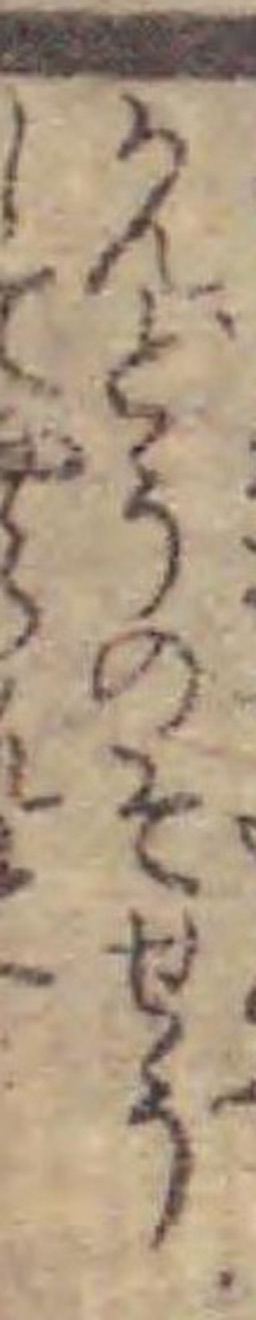してやらんと
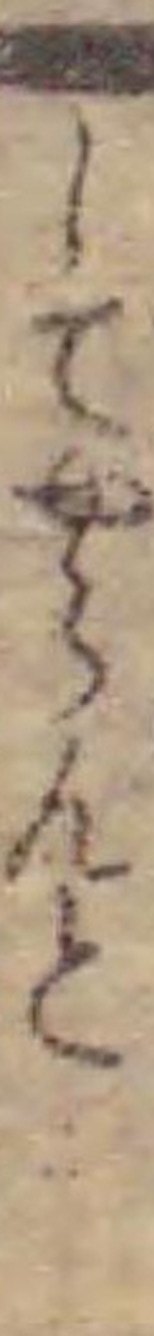してやらんと
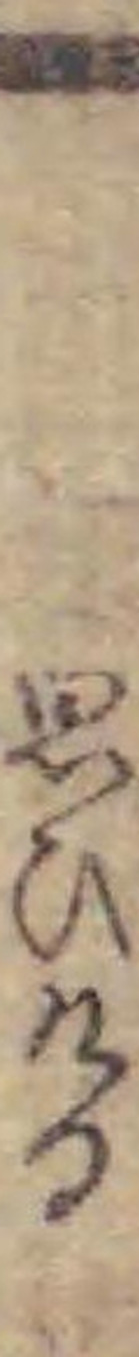思ひける
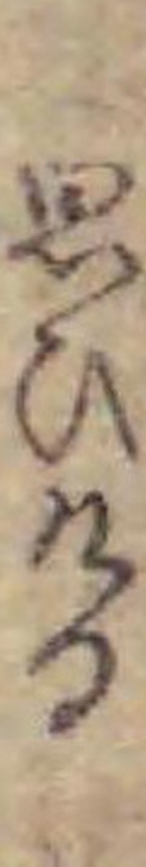思ひける
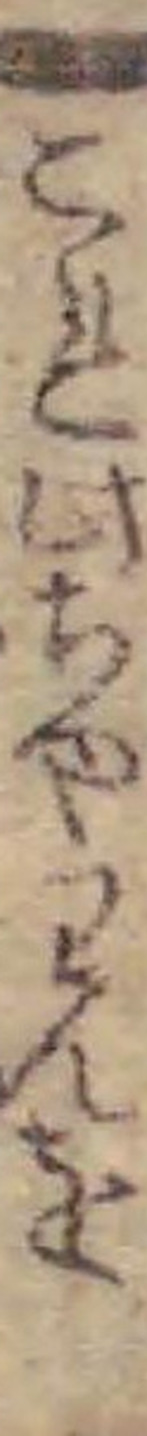これ此ちやわんを
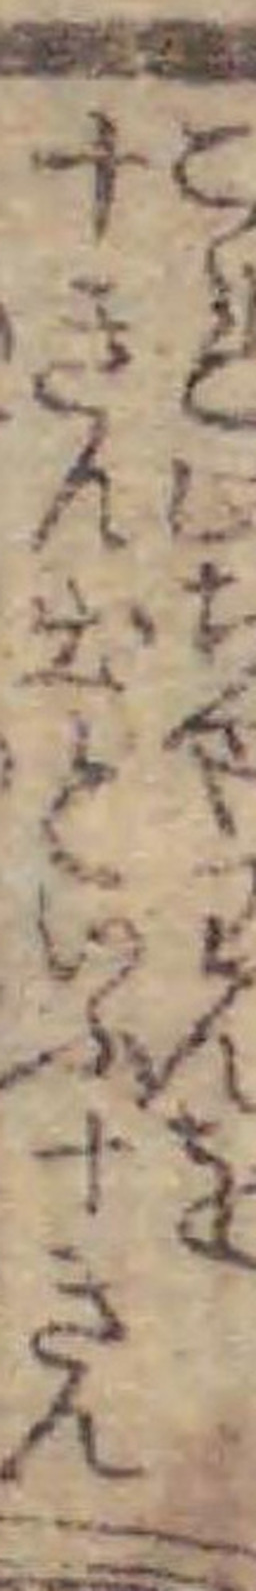十きん出といふ十きん
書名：此奴和日本 : 2巻
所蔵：国立国会図書館 National Diet Library, JAPAN
